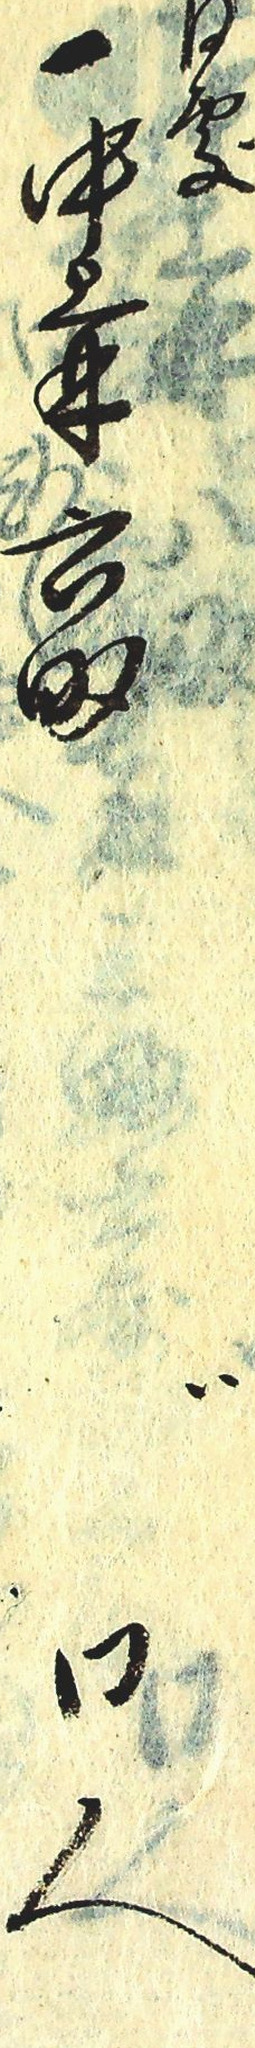一中上林六畝同人
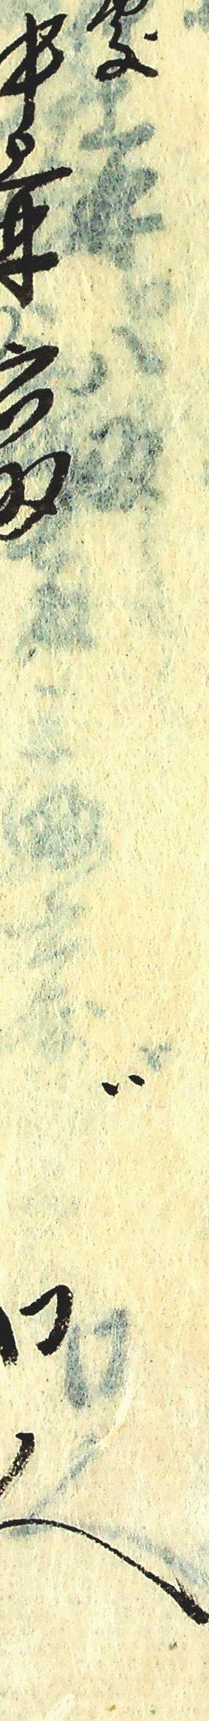一中上林六畝同人
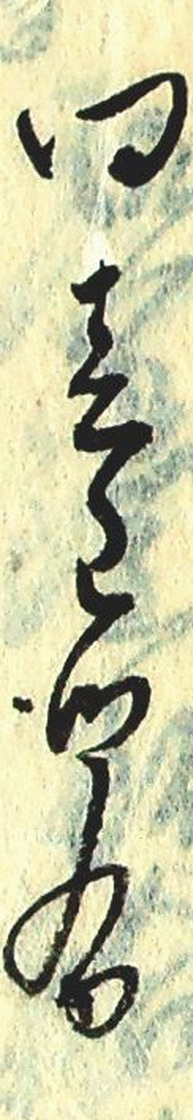同壱匁弐分
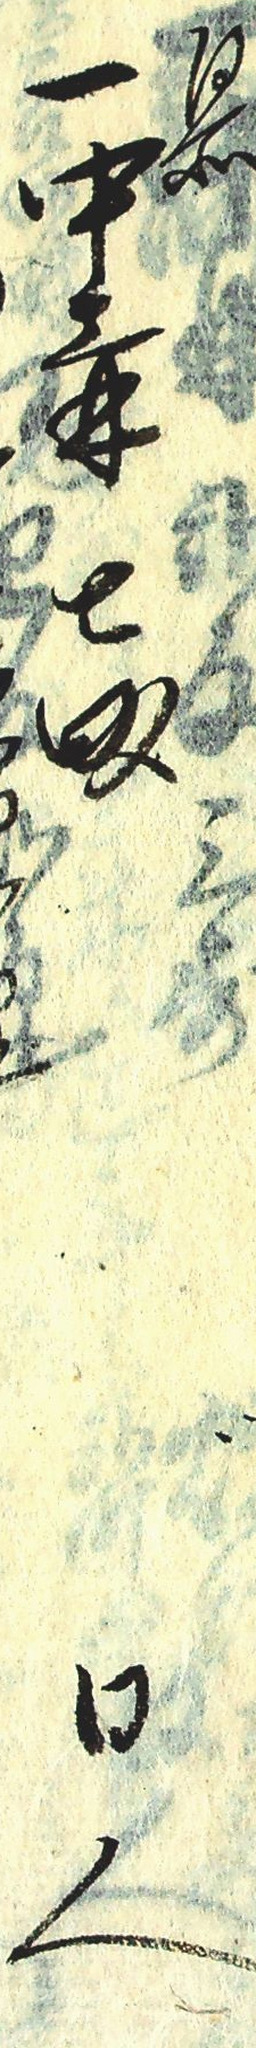一中上林七畝同人
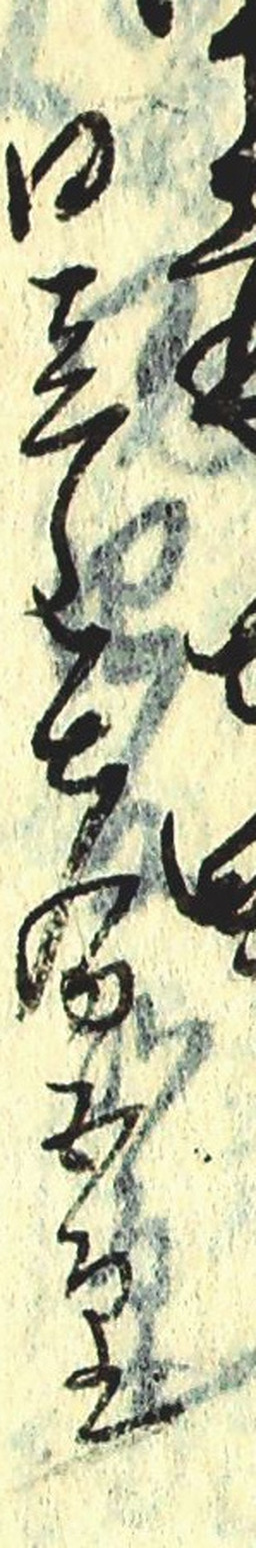同壱匁七分五厘

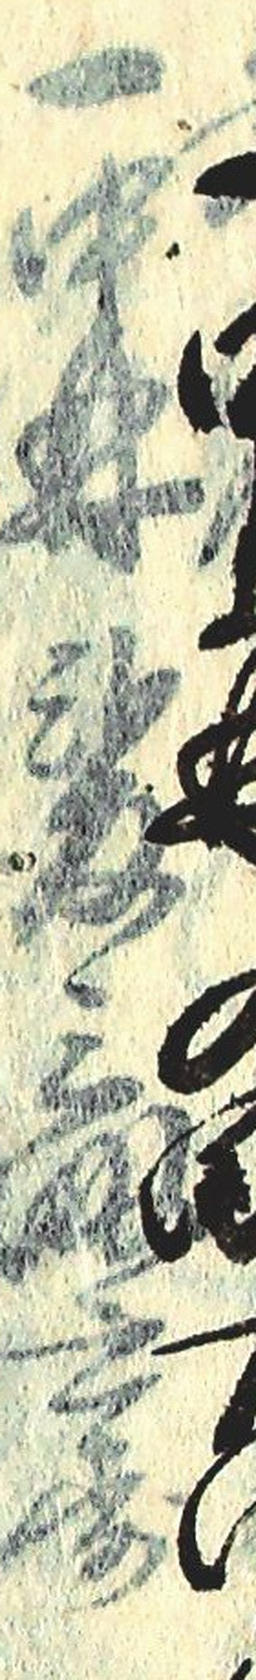一中林弐反三歩同人
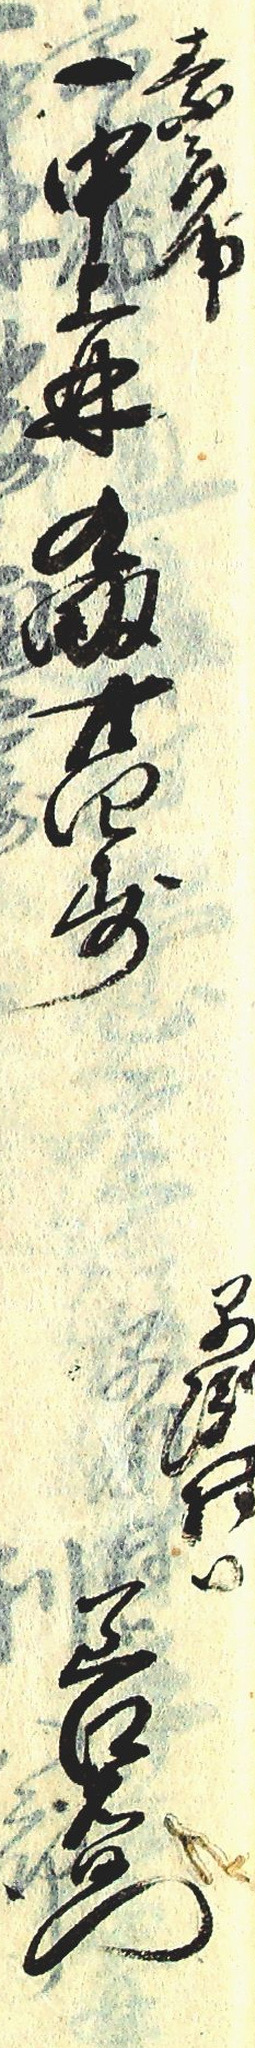一中上林九畝廿四歩善右衛門
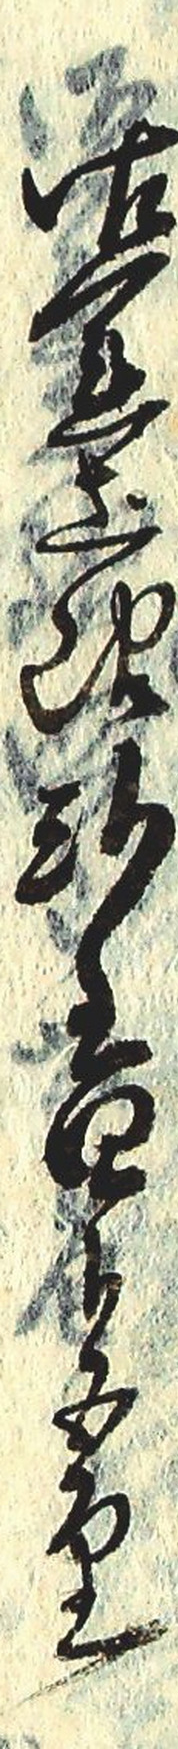御運上銀弐匁四分五厘
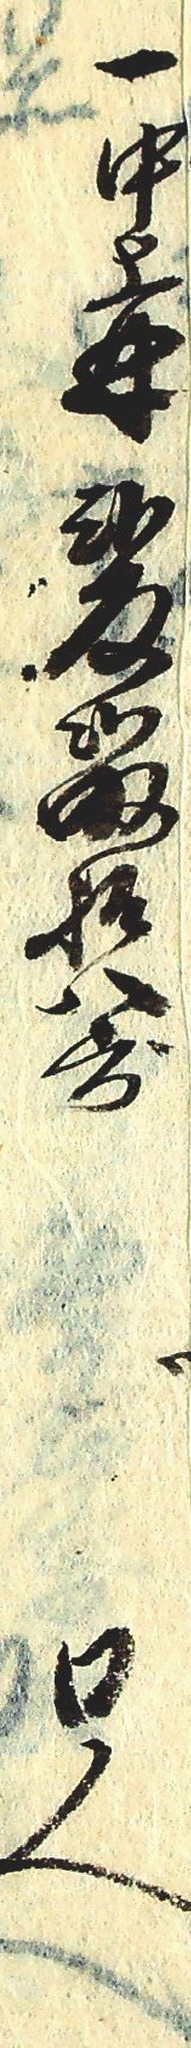一中上林弐反弐畝拾八歩同人
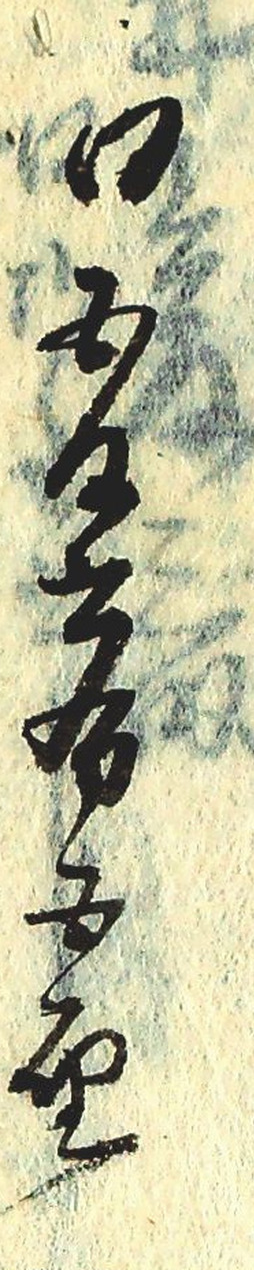同五匁六分五厘
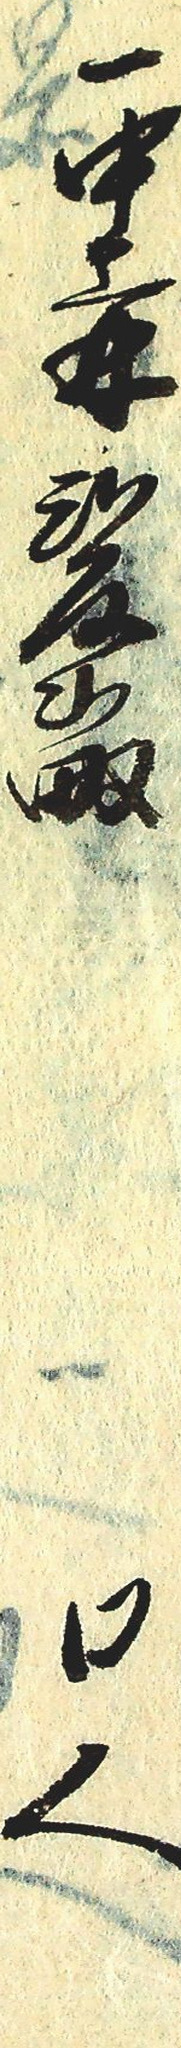一中上林弐反弐畝同人
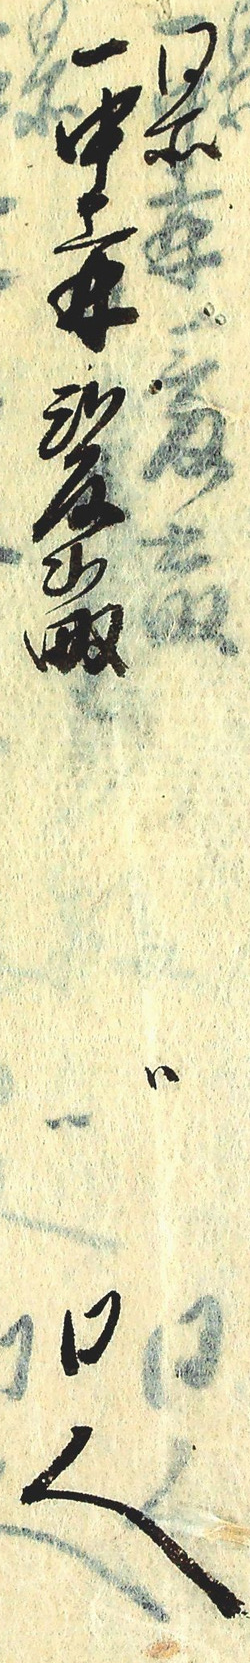一中上林弐反弐畝同人
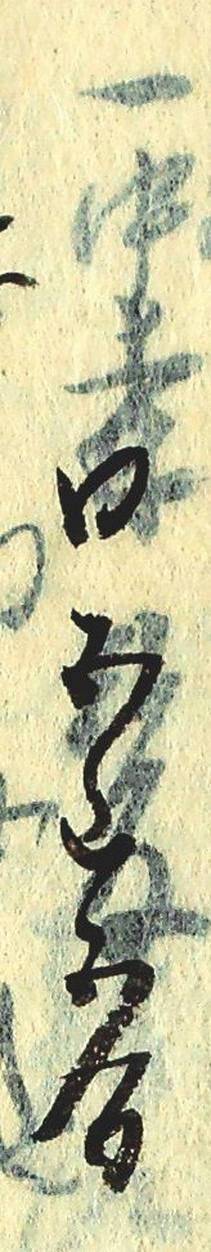同五匁五分
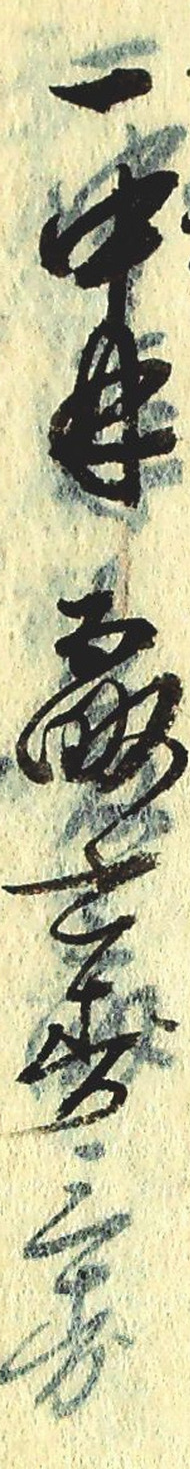一中林五畝六歩利八郎
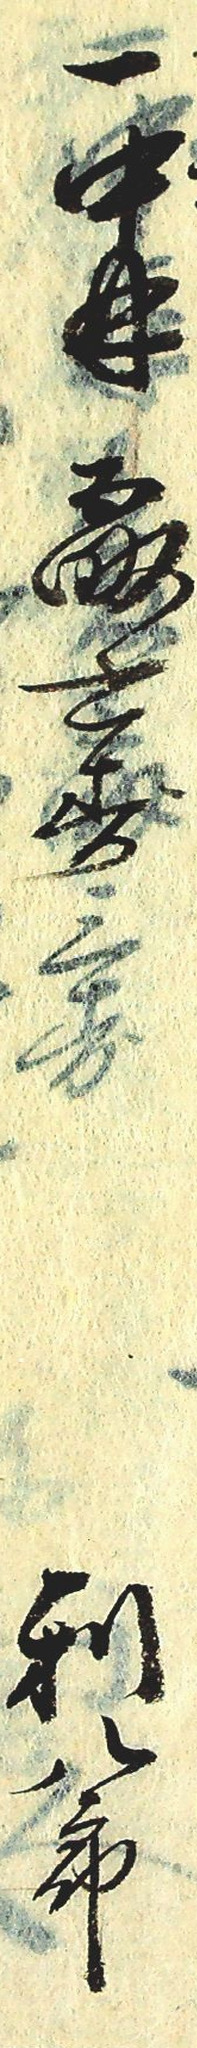一中林五畝六歩利八郎
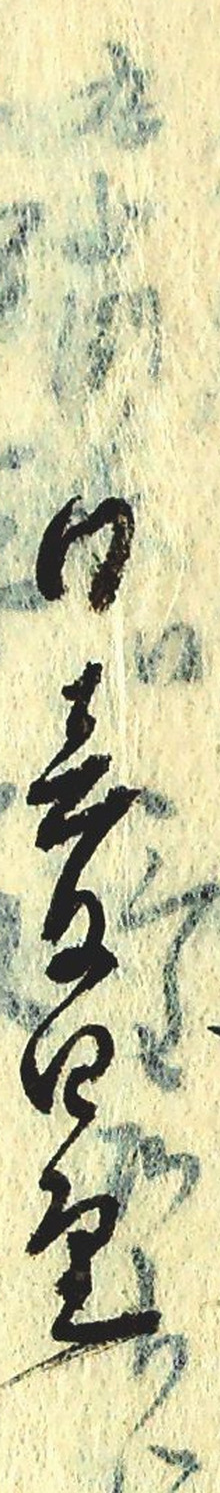同壱匁四厘
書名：諸御願書控(弐番）
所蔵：鳴門教育大学 Naruto University of Education
